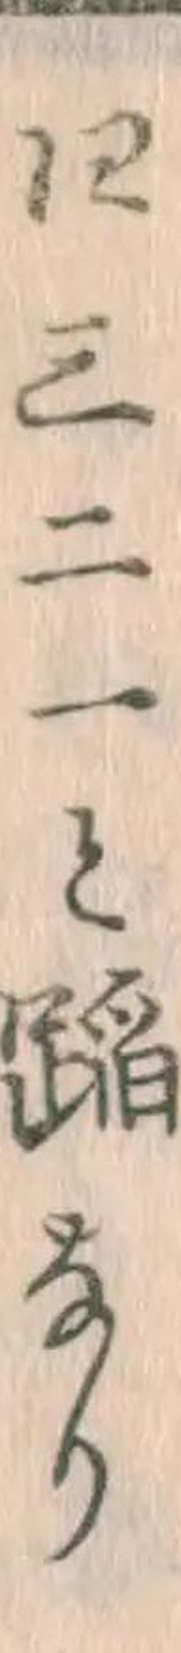四三二一と蹈なり
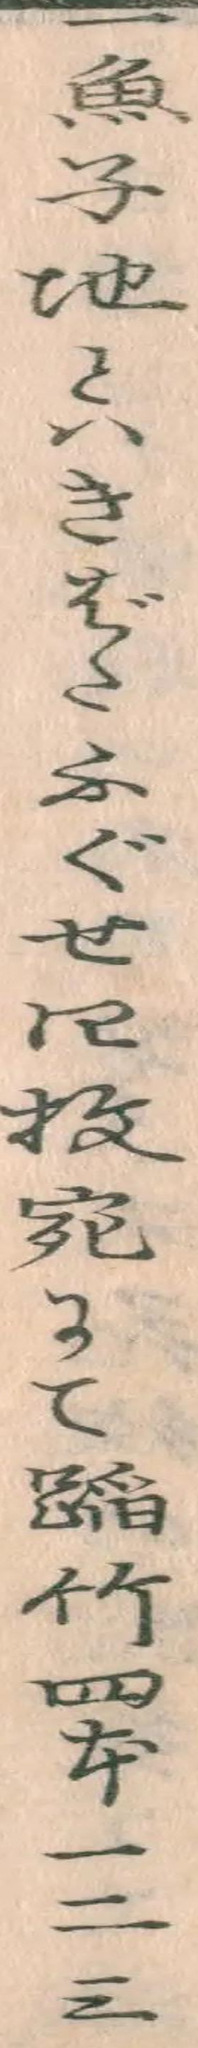一魚子地とはきばたふぐせ四枚宛にて蹈竹四本一二三
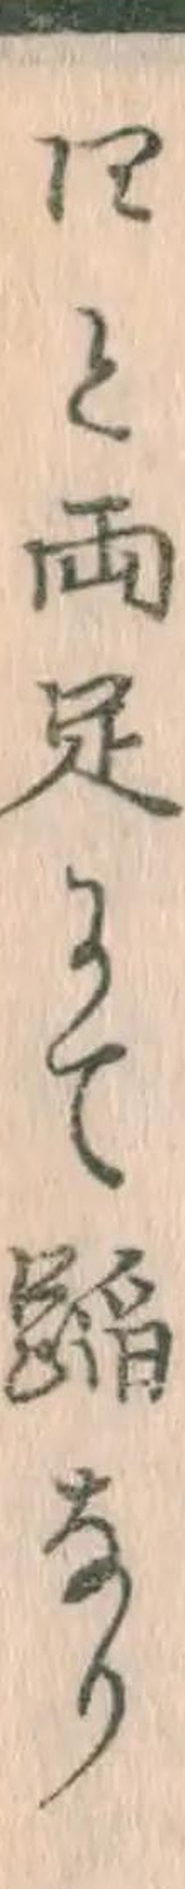四と両足にて蹈なり
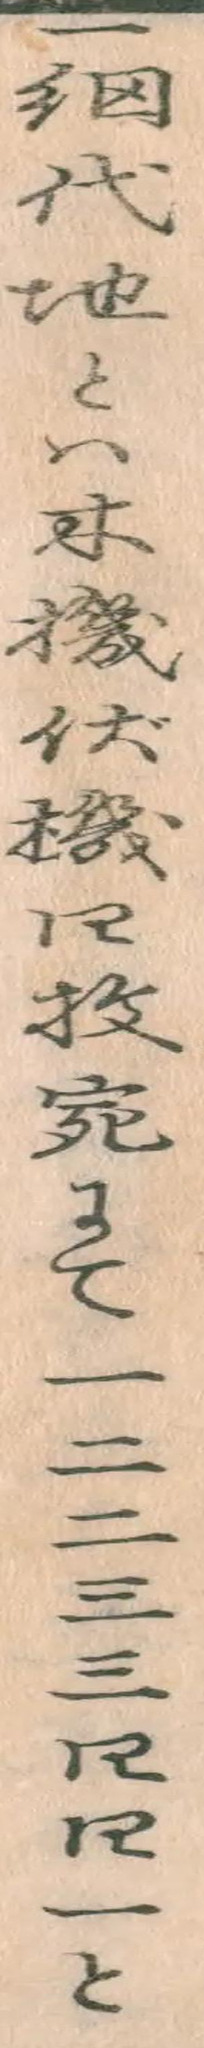一網代地とは木機伏機四枚宛にて一二二三三四四一と
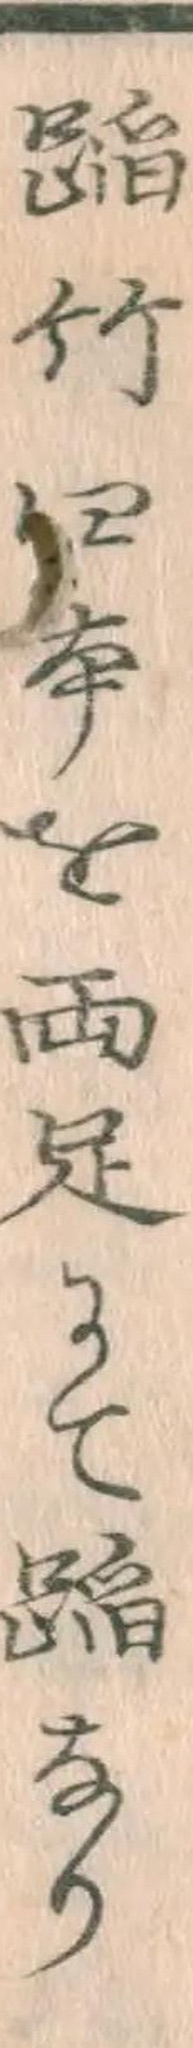蹈竹四本を両足にて蹈なり
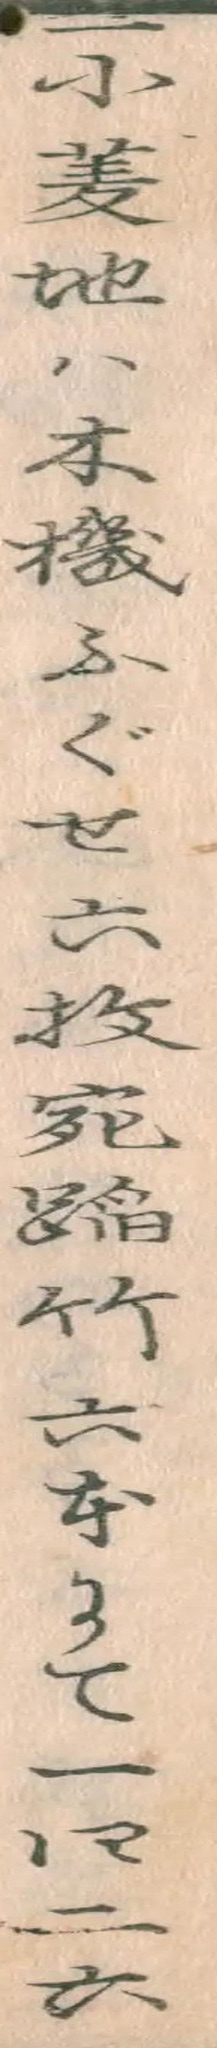一小菱地は木機ふぐせ六枚宛蹈竹六本にて一四二六
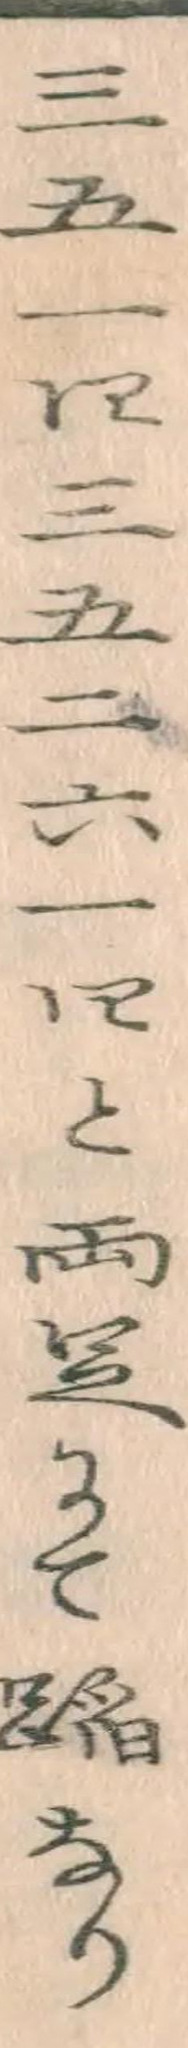三五一四三五二六一四と両足にて蹈なり
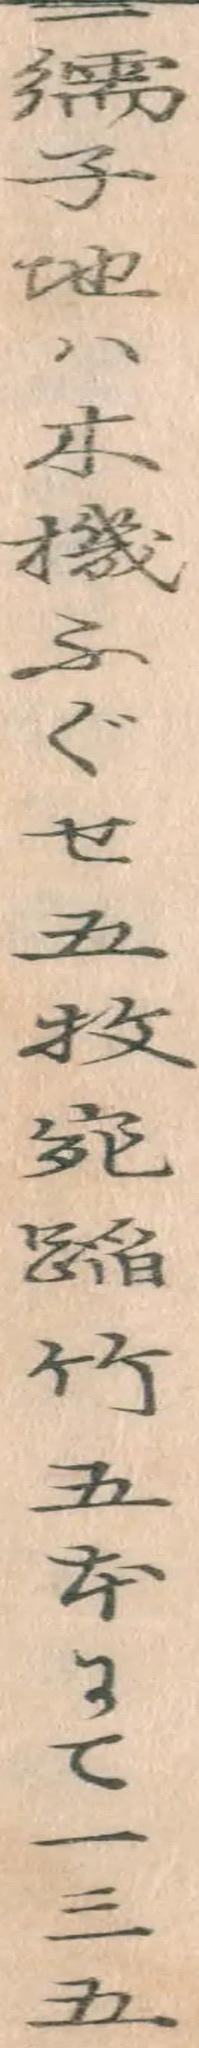一繻子地は木機ふぐせ五枚宛蹈竹五本にて一三五
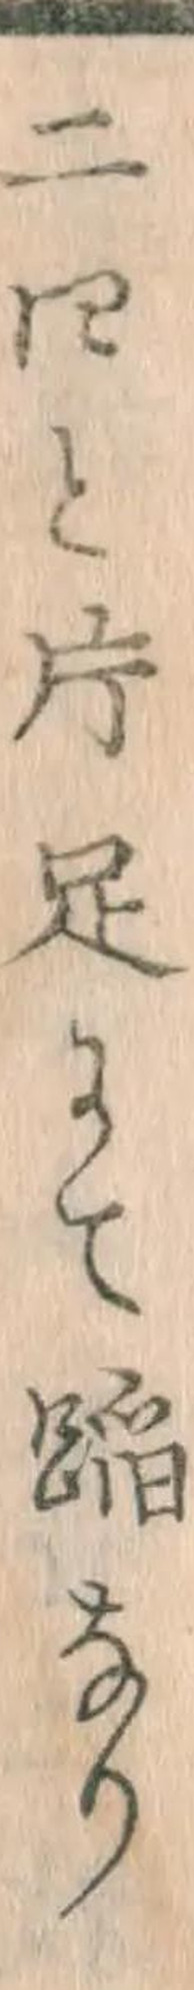二四と片足にて蹈なり

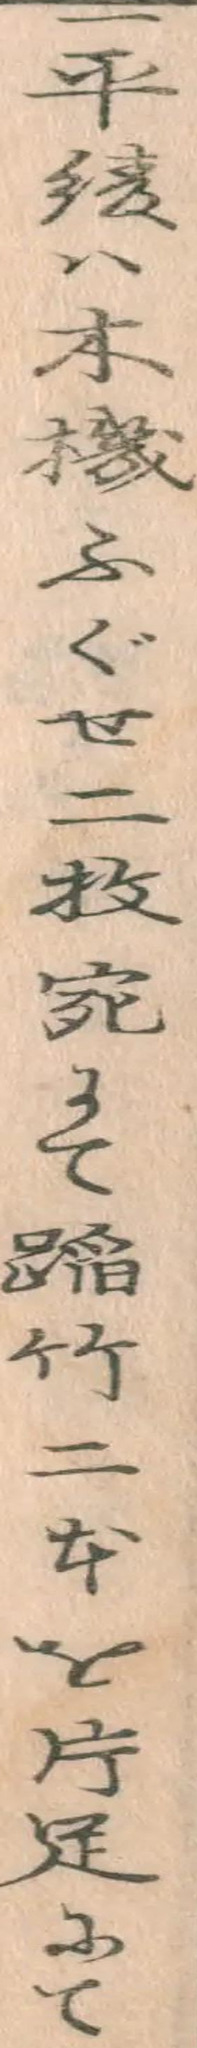一平綾は木機ふぐせ二枚宛にて蹈竹二本を片足にて
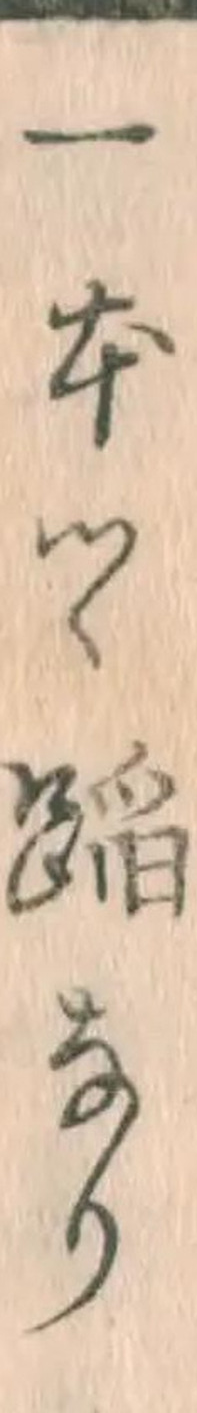一本つゝ蹈なり
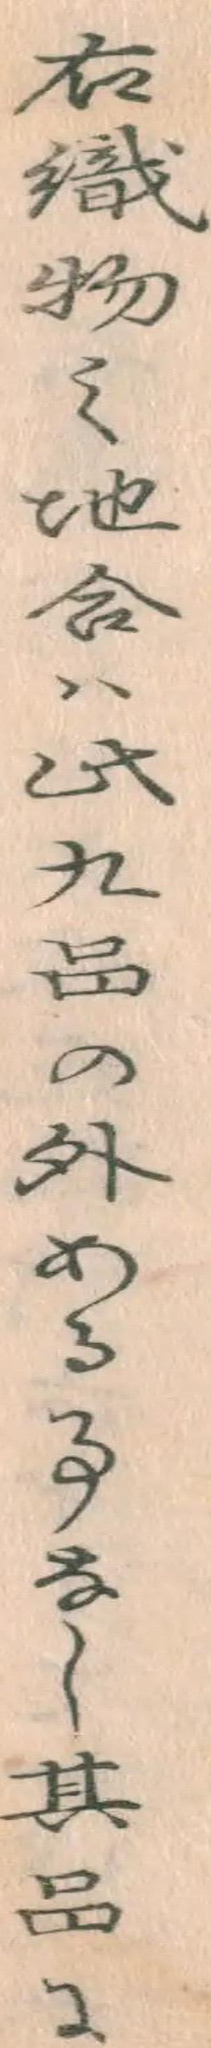右織物之地合は此九品の外ある事なし其品に
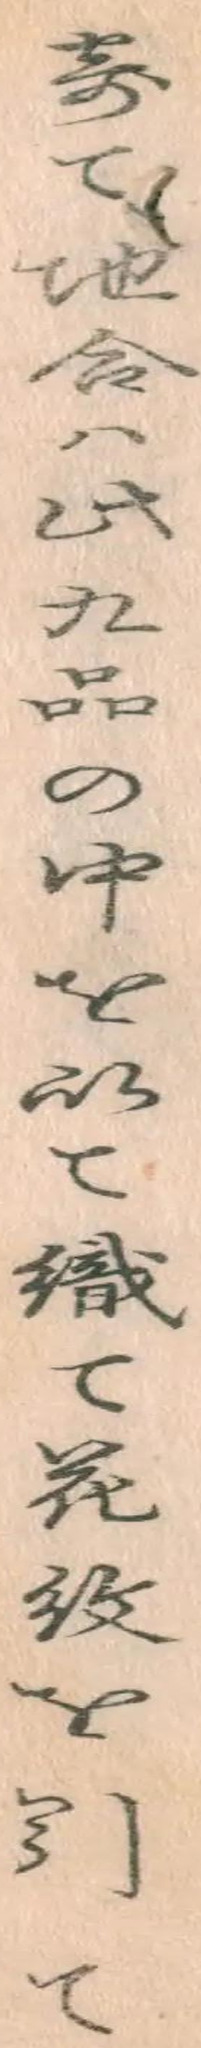寄て地合は此九品の中を以て織て花紋を引て
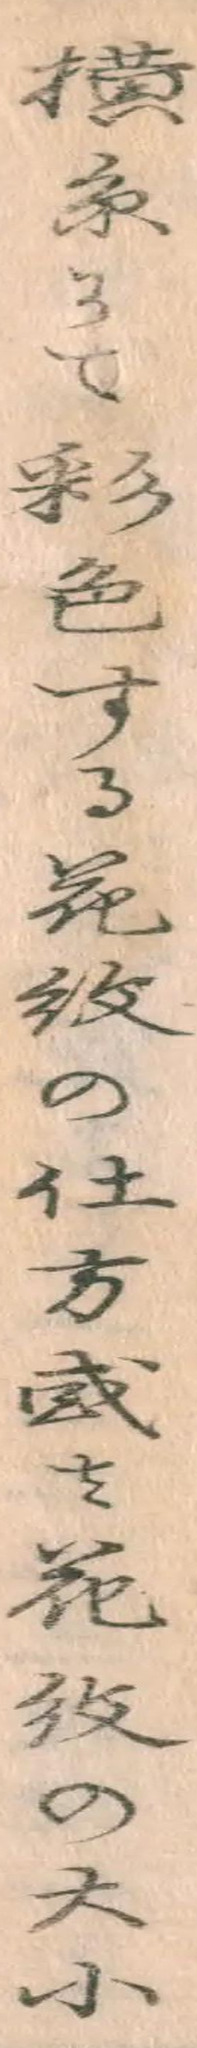横糸にて彩色する花紋の仕方或は花紋の大小
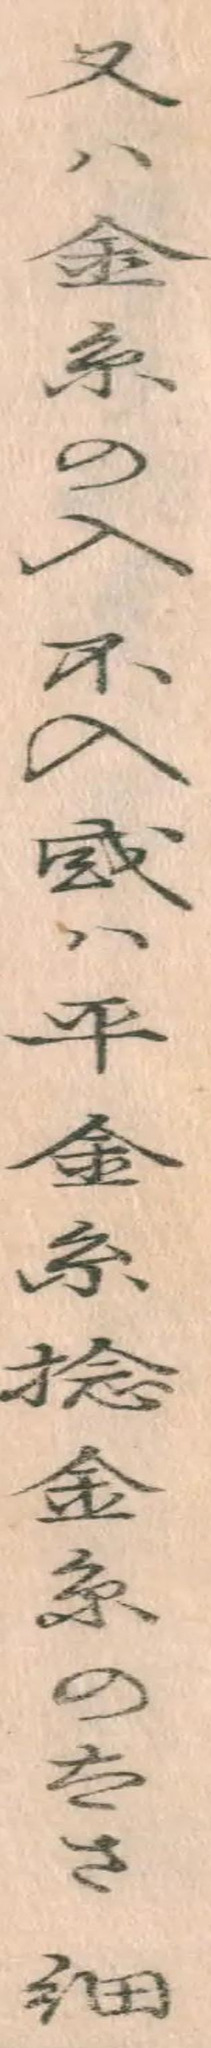又は金糸の入不入或は平金糸捻金糸の太さ細
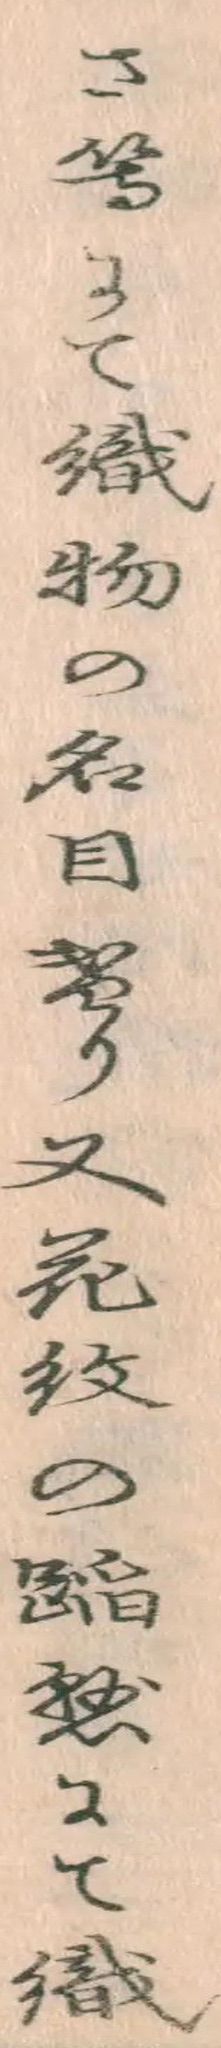さ等にて織物の名目替り又花紋の蹈懸にて織
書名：機織彙編 5巻. [2]
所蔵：国立国会図書館 National Diet Library, JAPAN
